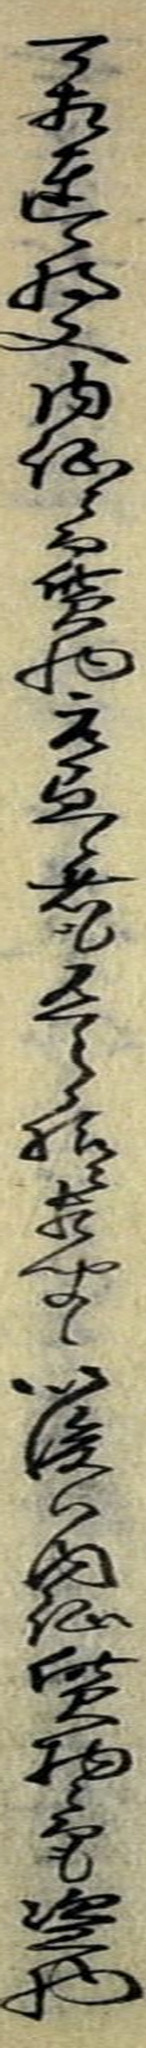可相達候将又内証ニ而質物取置候者も有之候様ニ相聞候以後ハ内証質物ニ而も盗物
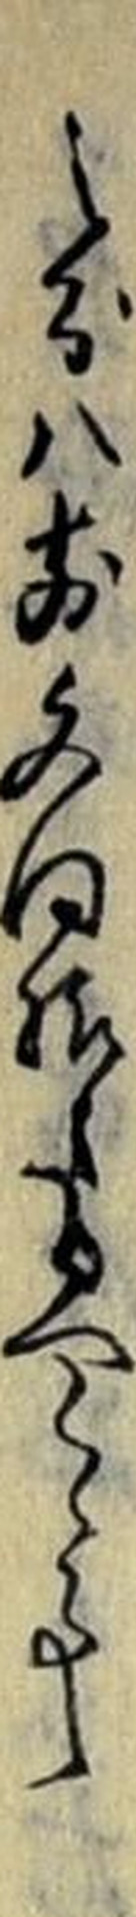之分ハ前文同様たるへく候事
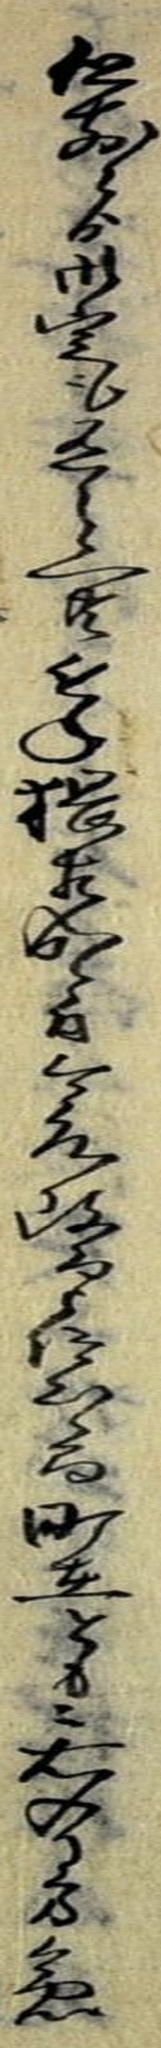但前々ゟ御定も有之候へ共近年猥相成候ニ付今度改而被仰出候間町在ともニ右〆り方急
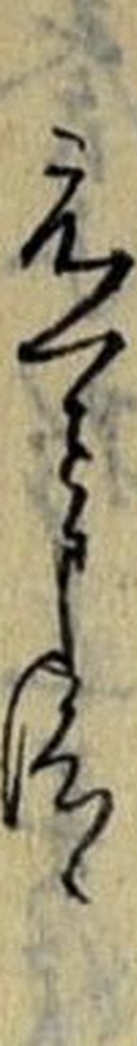度可被申渡候
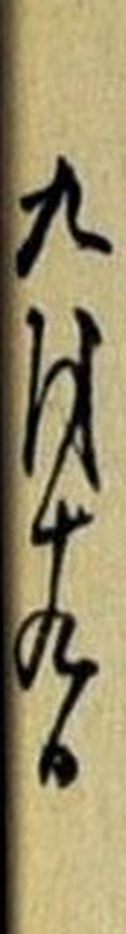九月十九日
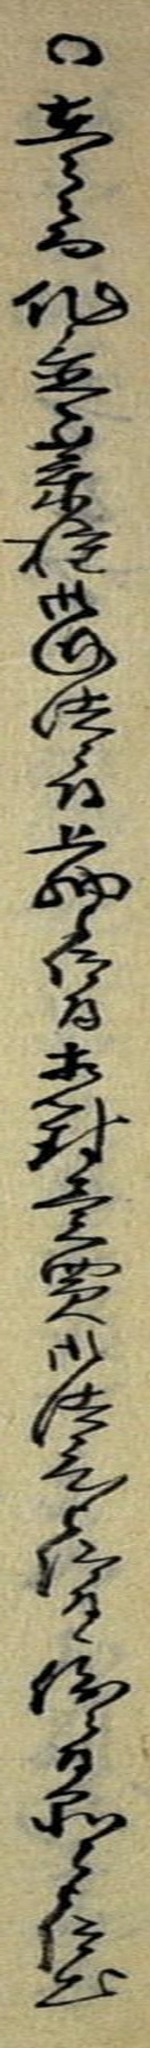〇在々ニ而作置候薬種御趣法ニ付上納被仰付相対売買御法度被仰付候儀ニ付品々被仰出
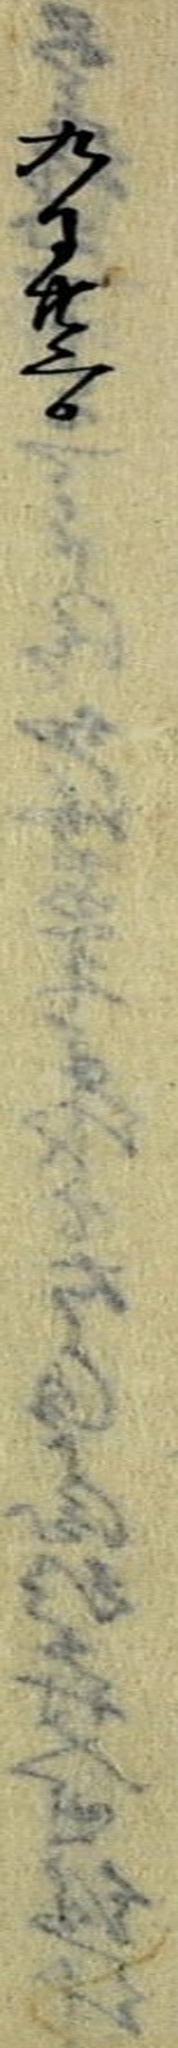九月廿二日
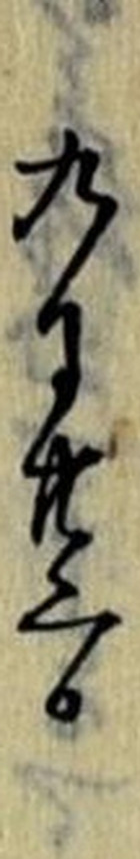九月廿二日
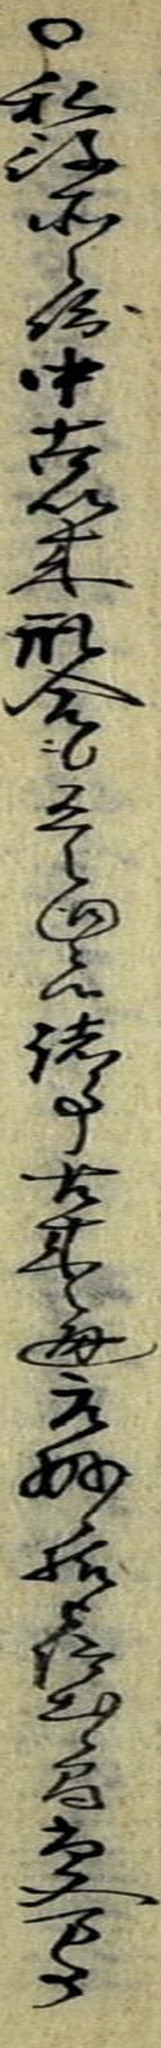〇私役所之儀中古以来形合も有之趣ニ候諸事古来之通取扱被仰出候間尚又万事
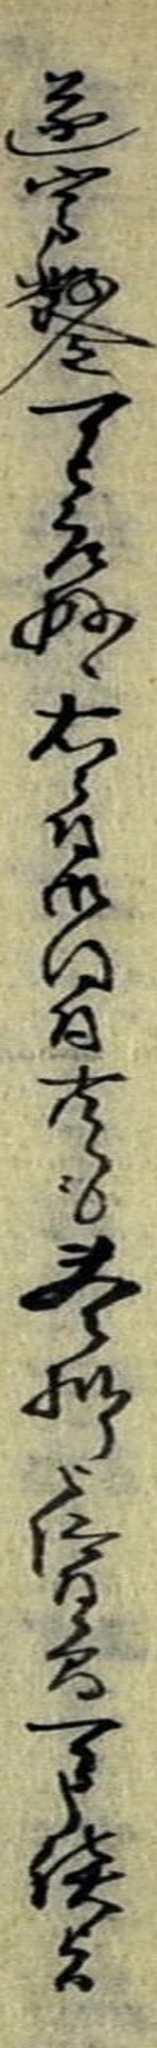遂穿鑿可被取扱候右ニ付御目付共へも夫々掛り被仰付候間可申談旨
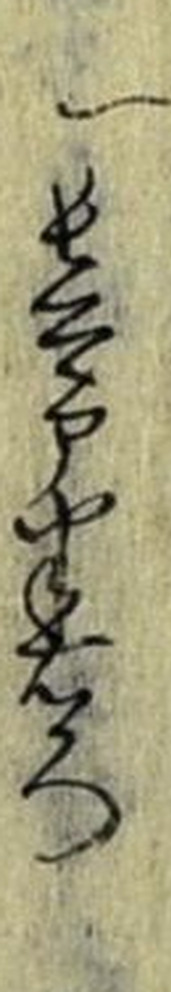長谷部半右衛門
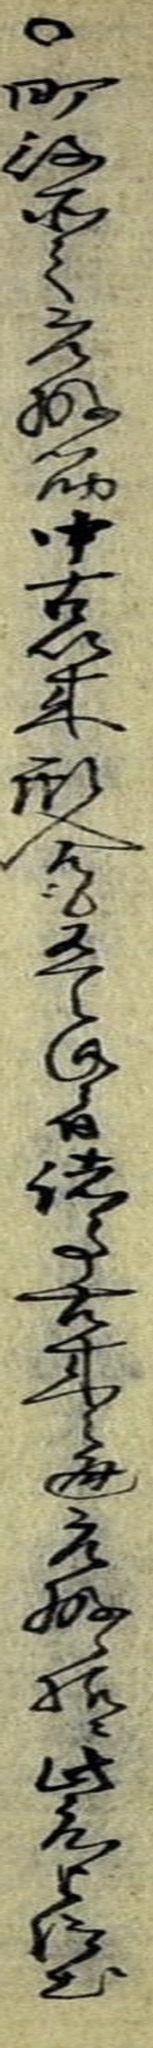〇町役所之取扱筋中古以来形合も有之趣ニ付諸事古来之通取扱候様ニ此度被仰出
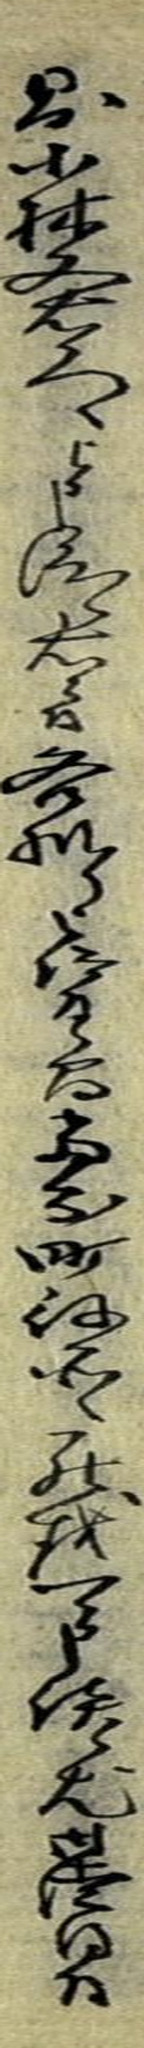則小林又右衛門へ被申渡候右ニ付各掛り被仰付候間当分町役所へ罷越可申談候尤御徒目付
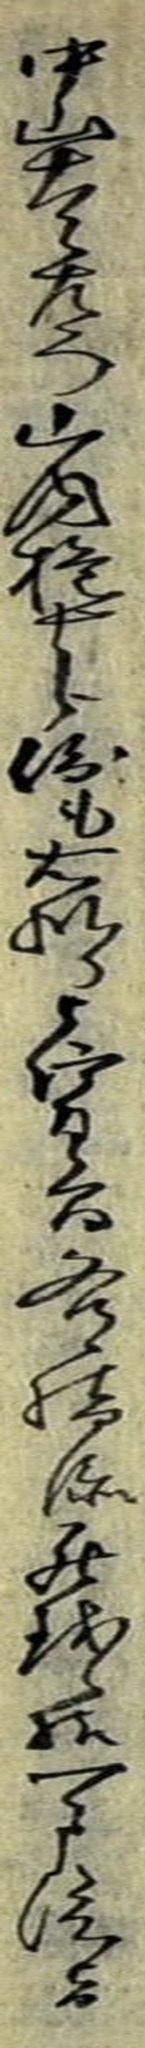中山太郎左衛門山内権十郎儀も右掛り被仰付候間各指添罷越候様可申渡旨
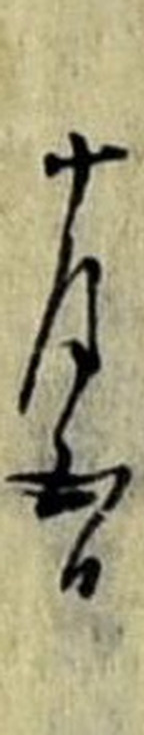十月五日
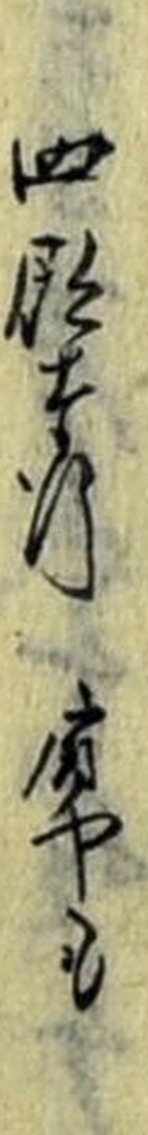四郡奉行府中へも
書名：命令之部 三
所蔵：福井県文書館 Fukui Prefectural Archives
